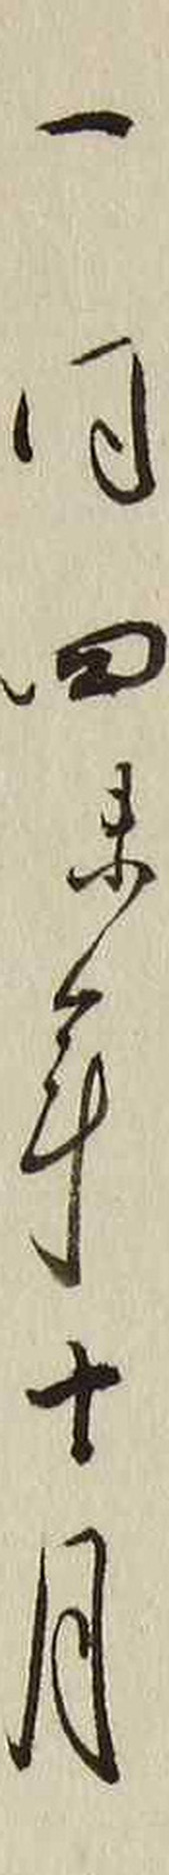一同四未年十月
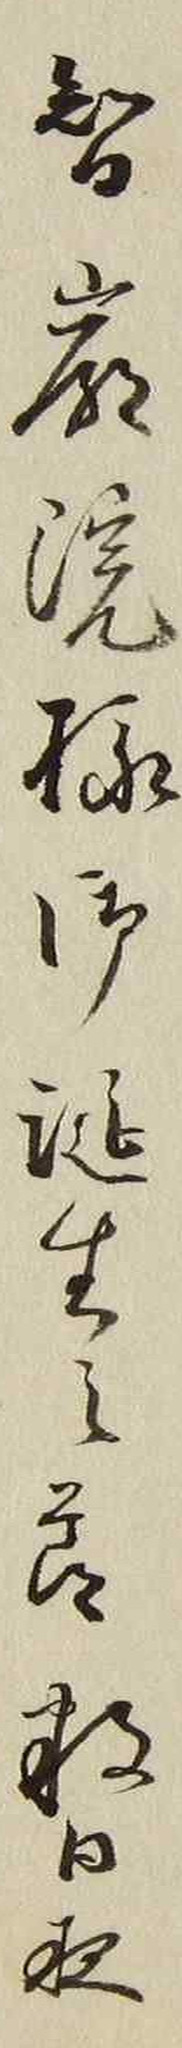智厳院様御誕生之節数日夜
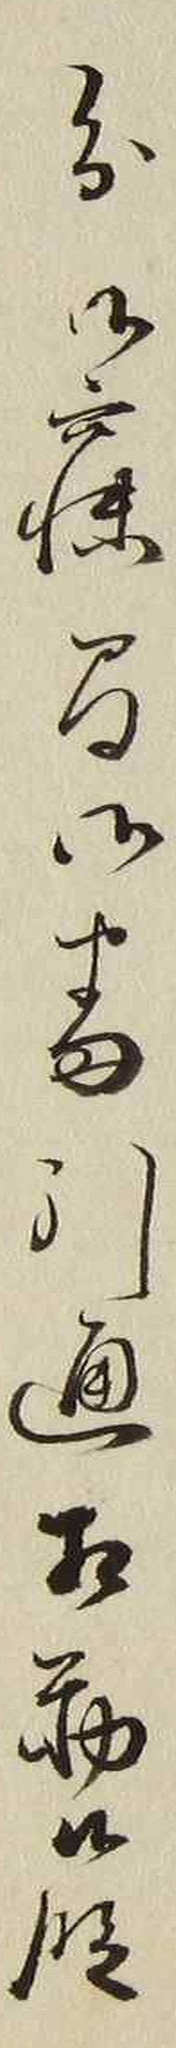分御寐間御番引通相勤候段
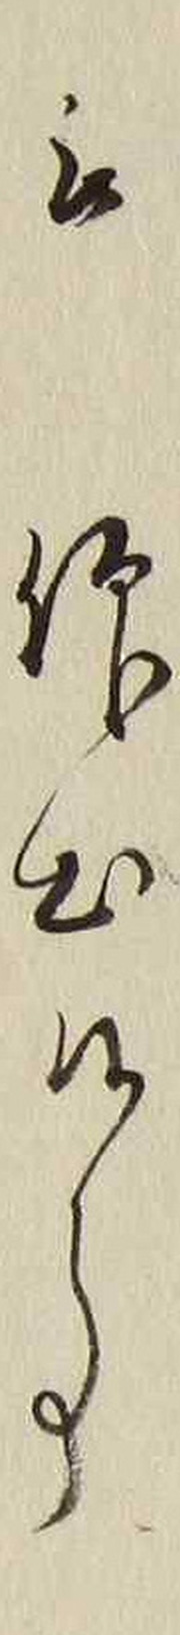被仰出候事
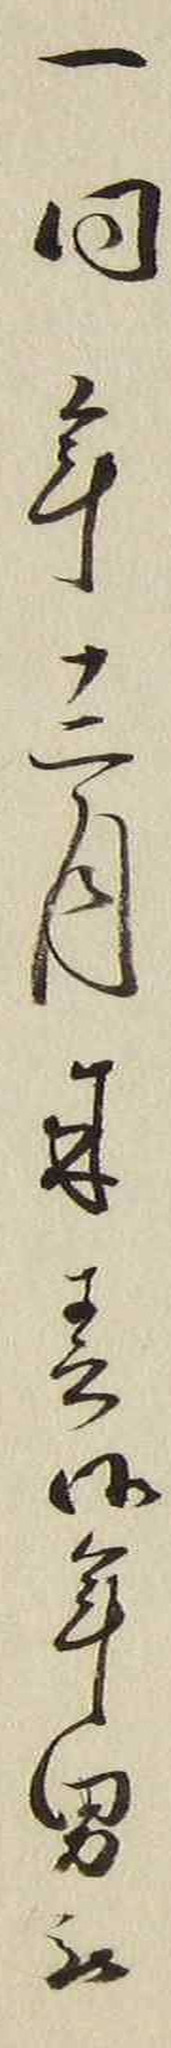一同年十二月来春御年男被
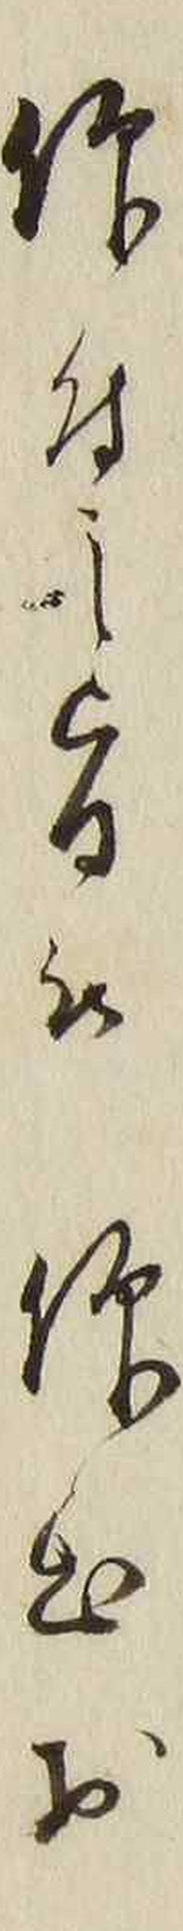仰付之旨被仰出於
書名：諸士系譜　巻之158　ね之部2
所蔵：会津若松市立会津図書館
